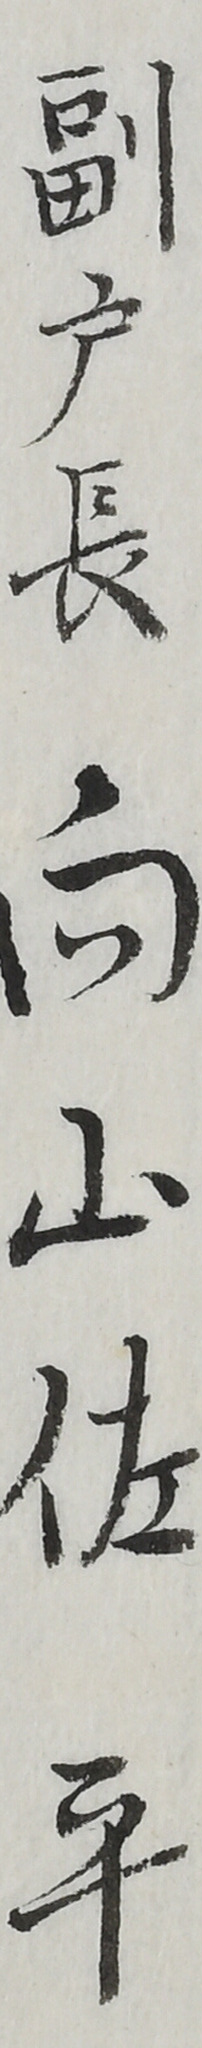副戸長向山佐平
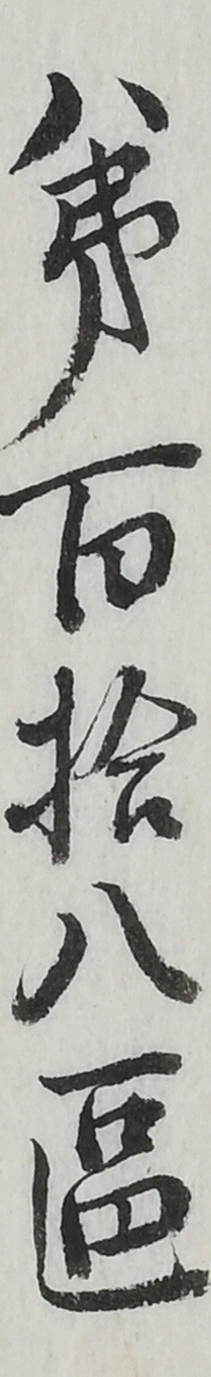第百拾八区
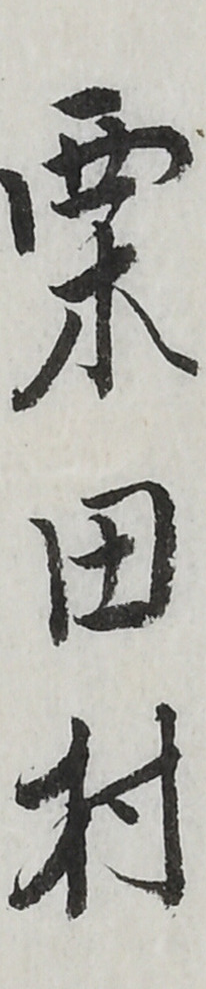栗田村
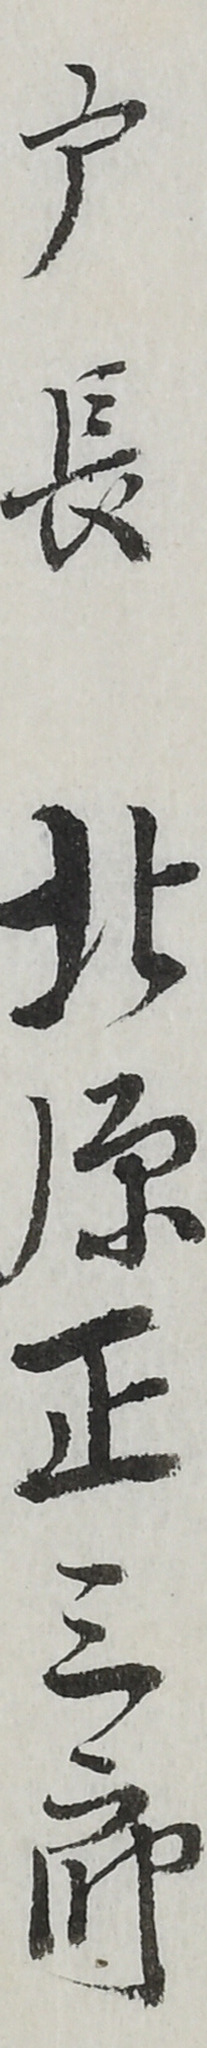戸長北原正三郎
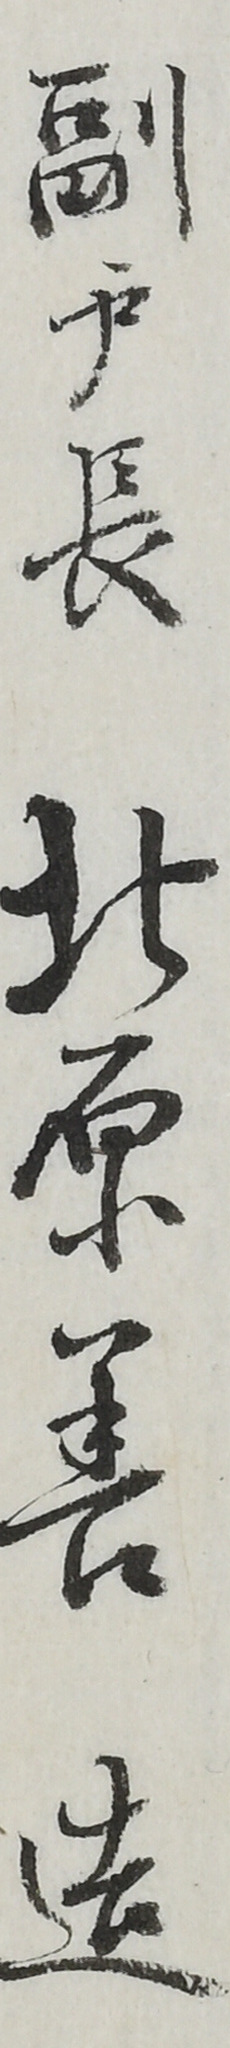副戸長北原善造

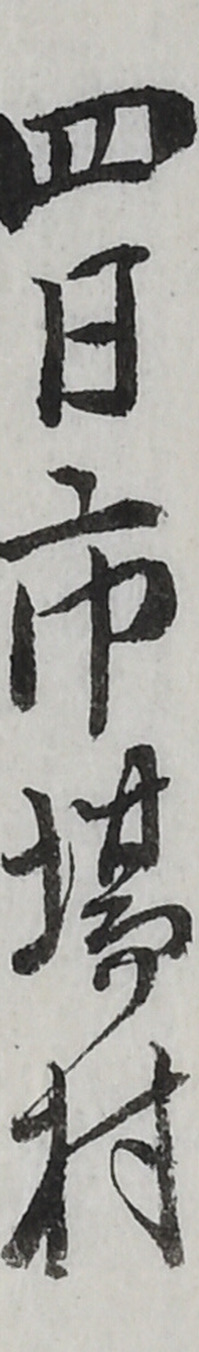四日市場村
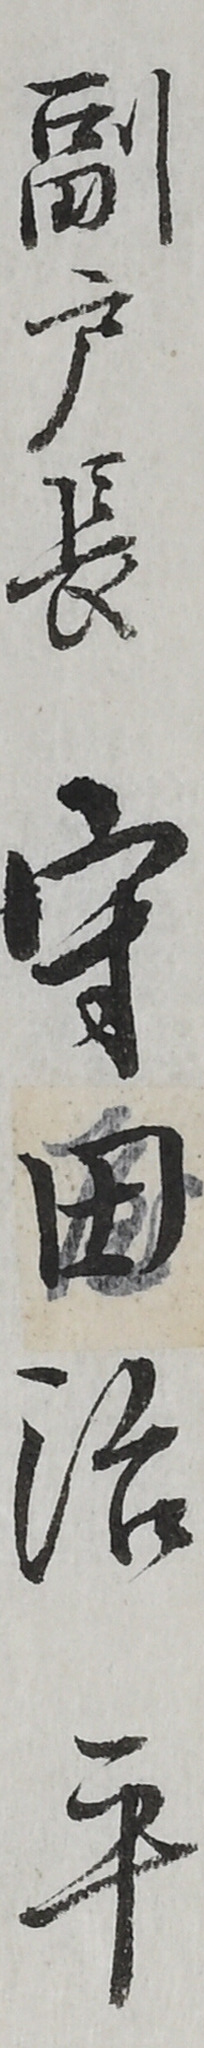副戸長守田治平
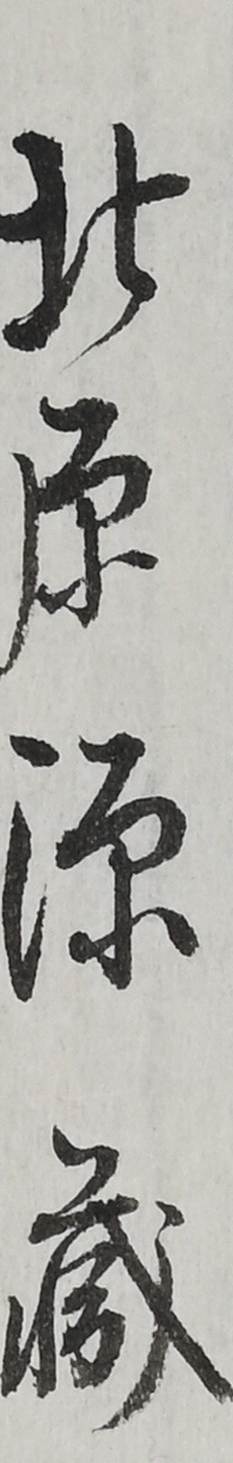同北原源蔵
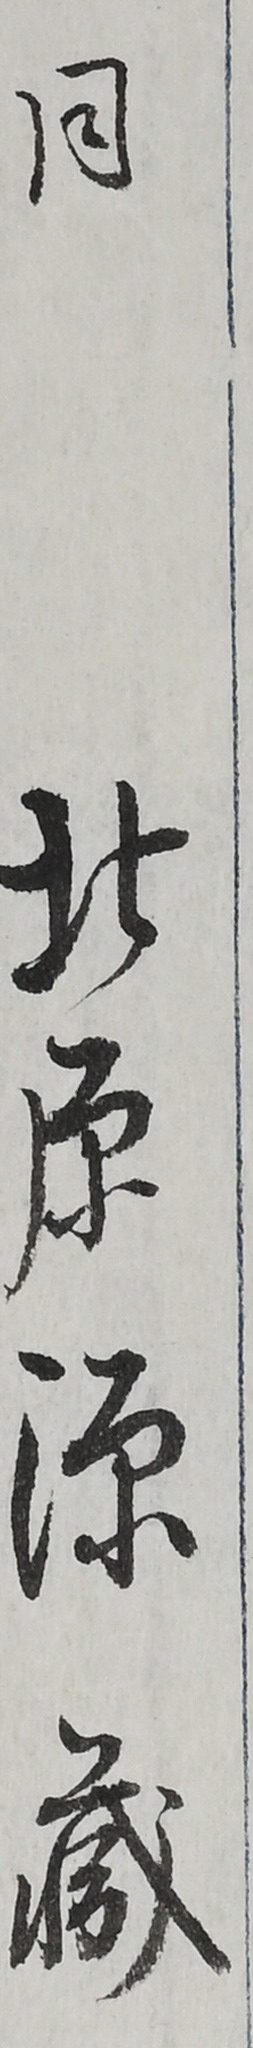同北原源蔵
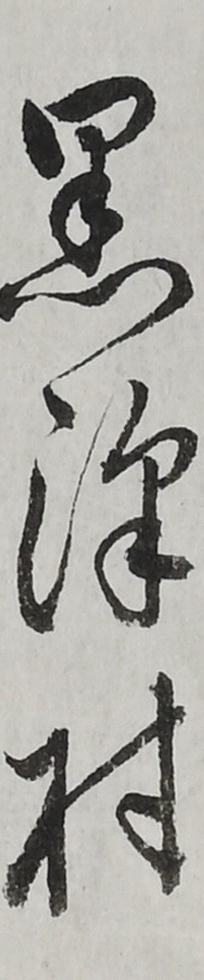黒沢村
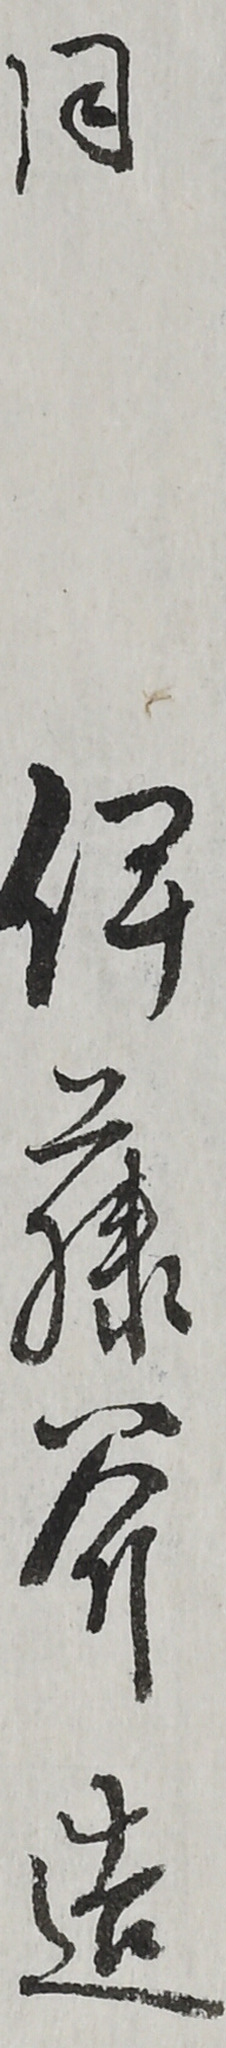同伊藤斧造
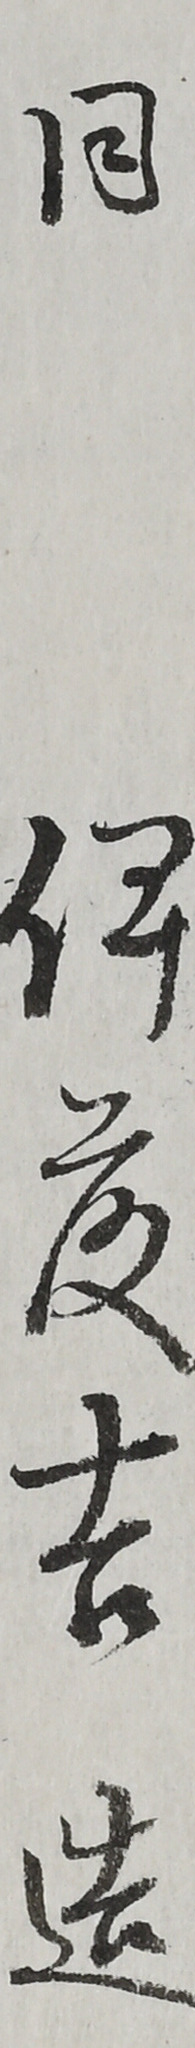同伊藤吉造
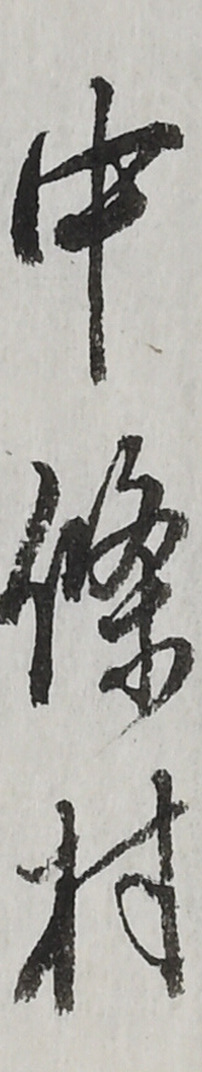中條村
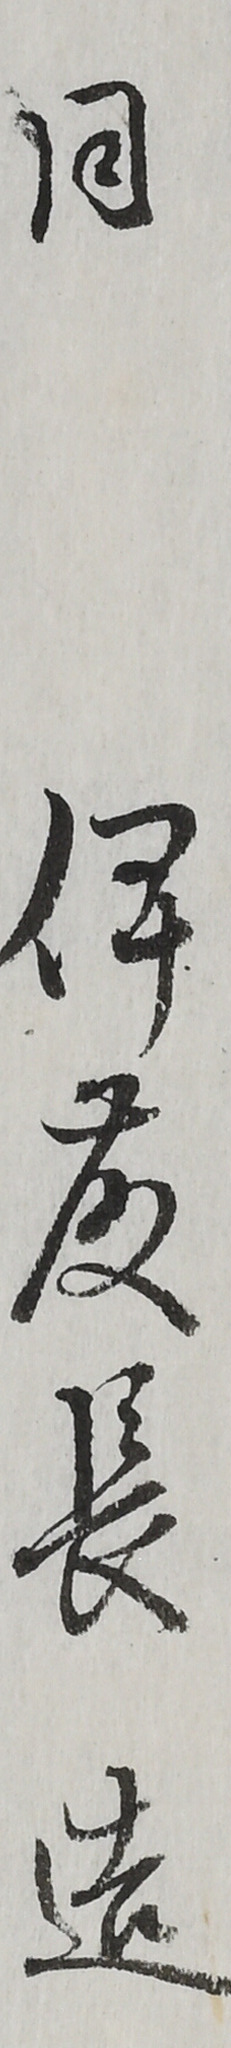同伊藤長造
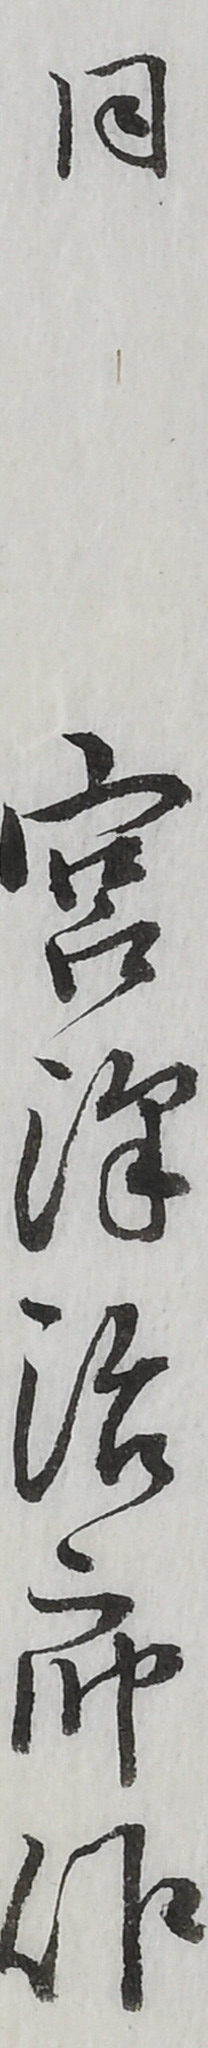同宮津治郎作
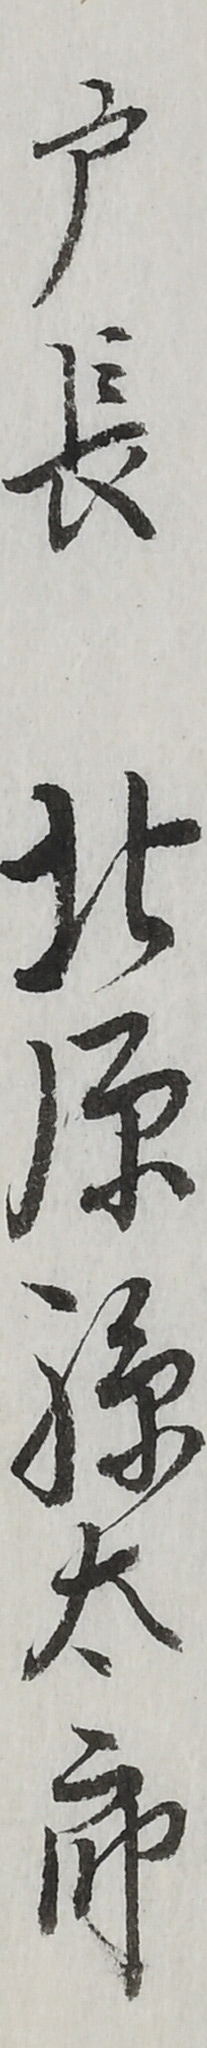戸長北原孫太郎
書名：伊那郡毎村戸長副戸長名簿
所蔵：伊那市立高遠町図書館・合同会社AMANE
